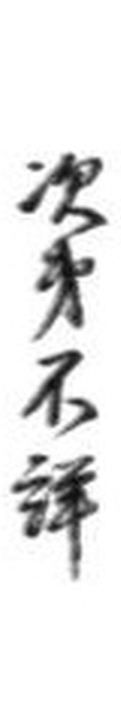次第不詳
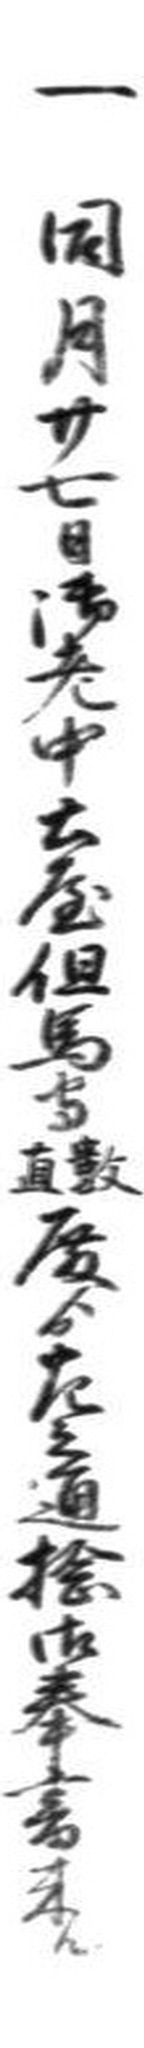一同月廿七日御老中土屋但馬守数直殿ゟ左之通捻御奉書来ル
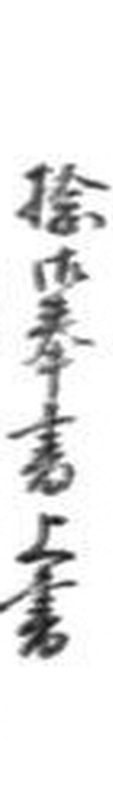捻御奉書上書
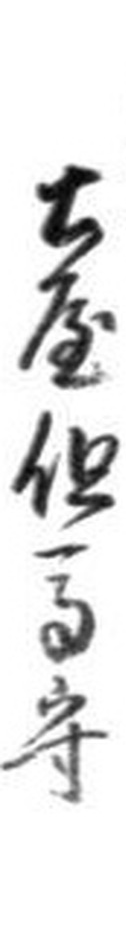土屋但馬守
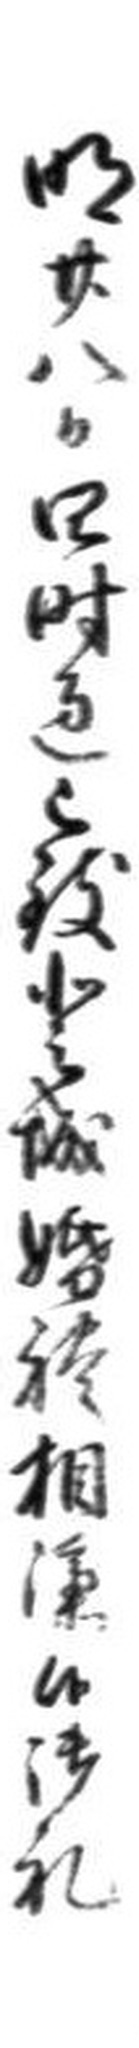明廿八日四時過被致登城婚礼相済候御礼

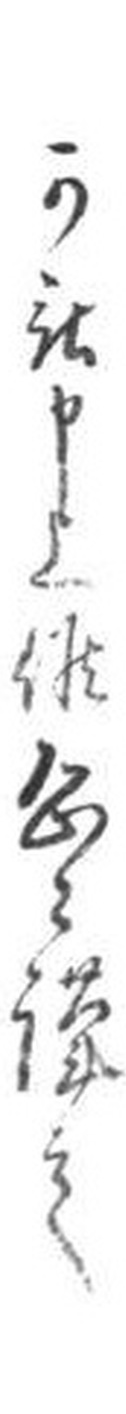可被申上候恐々謹言
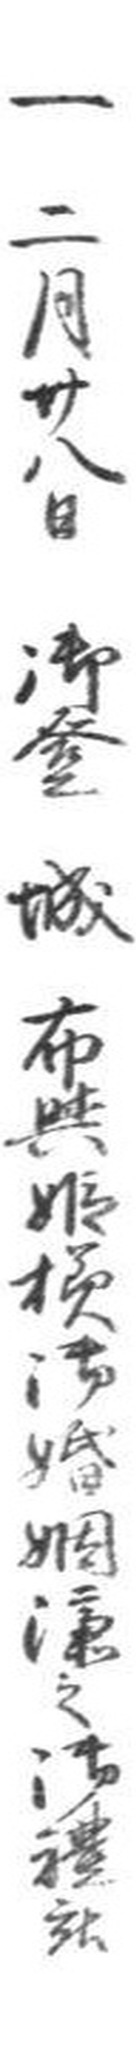一二月廿八日御登城布与姫様御婚姻済之御礼被
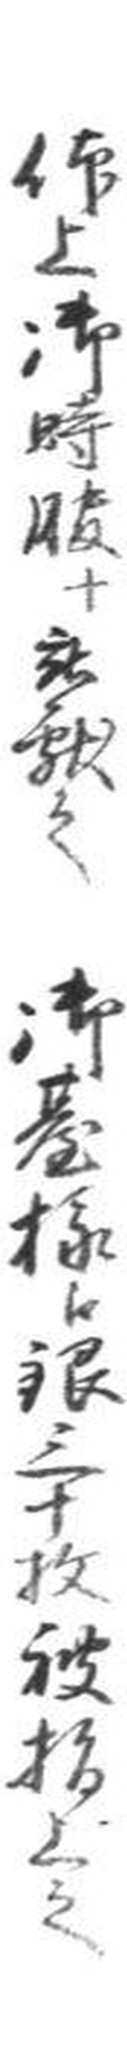仰上御時服十被献之御台様江銀三十枚被指上之
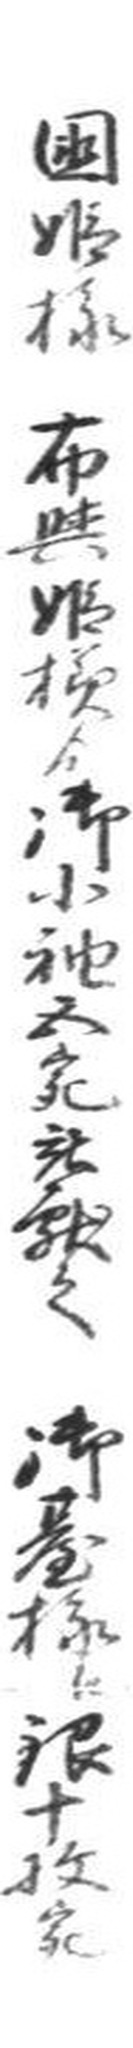国姫様布与姫様ゟ御小袖五宛被献之御台様江銀十枚宛
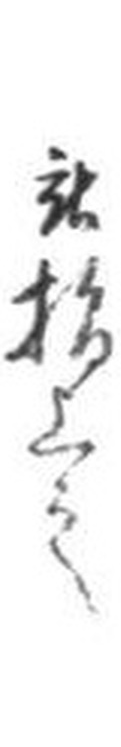被指上之
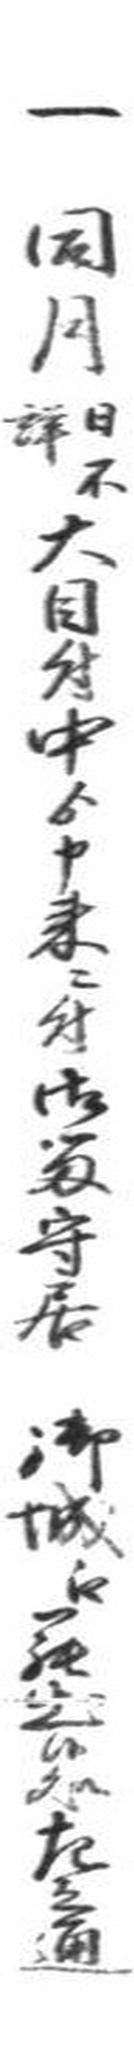一同月日不詳大目付中ゟ申来ニ付御留守居御城江罷出候処左之通
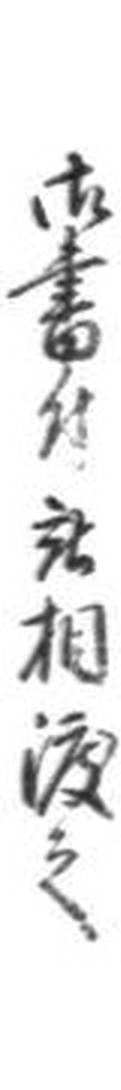御書付被相渡之
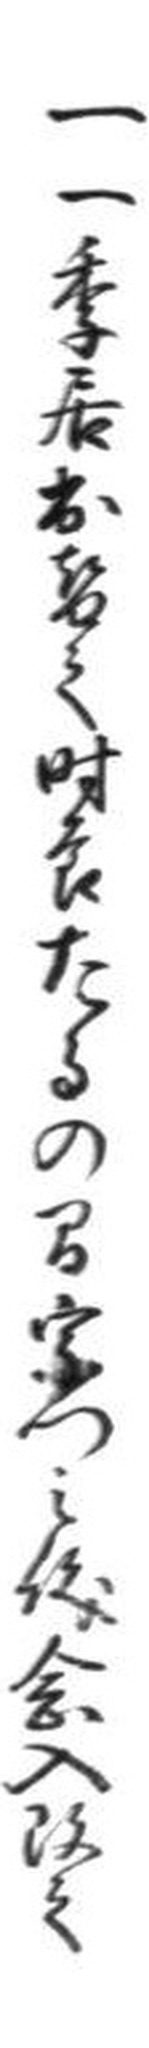一一季居出替之時節たるの間宗門之儀念入改之
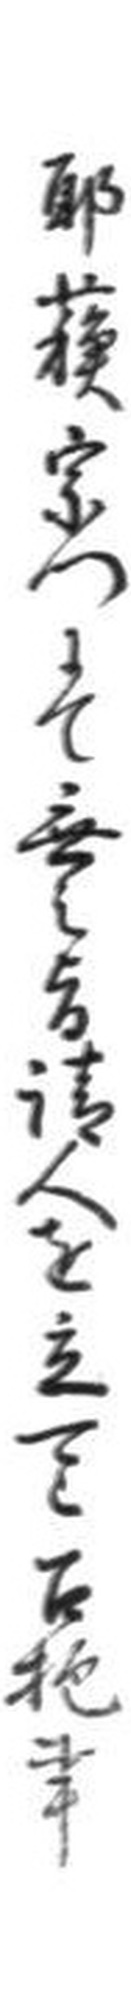耶蘇宗門にて無之旨請人を立可被召抱事
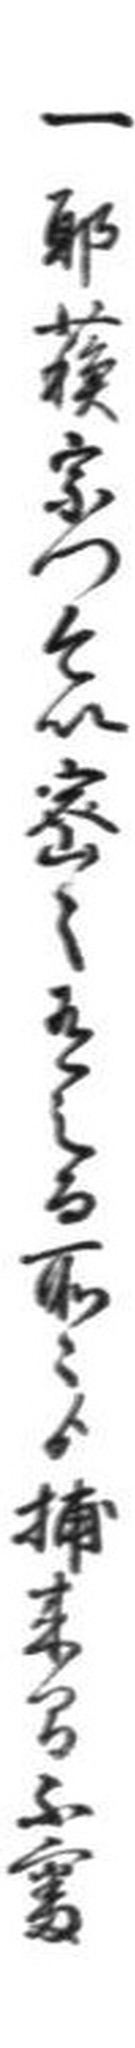一耶蘇宗門今以密々有之而所々ゟ捕来間不審
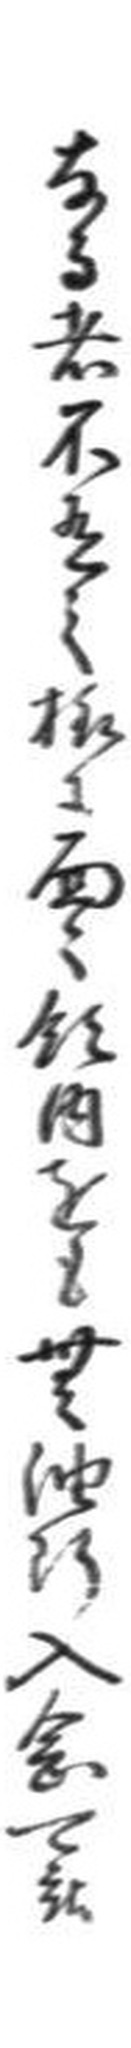なる者不有之様ニ面々領内をも無油断入念可被
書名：家譜 八 光通公 従寛文十年到同十二年
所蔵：福井県文書館 Fukui Prefectural Archives
